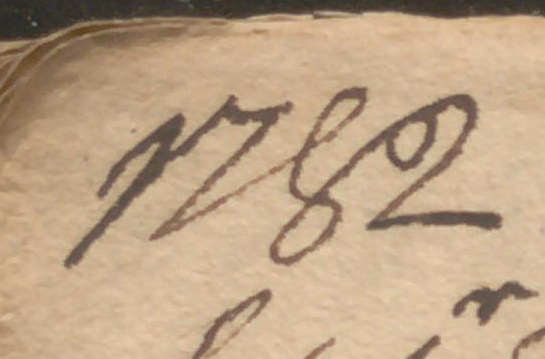1782
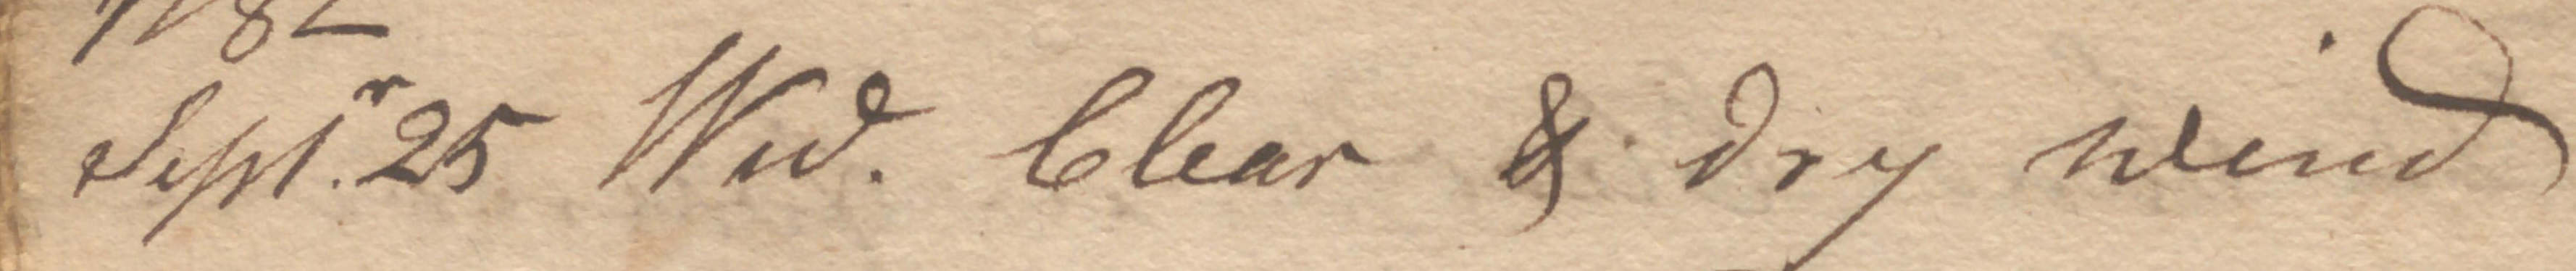Sept^r. 25 Wed. Clear & dry wind
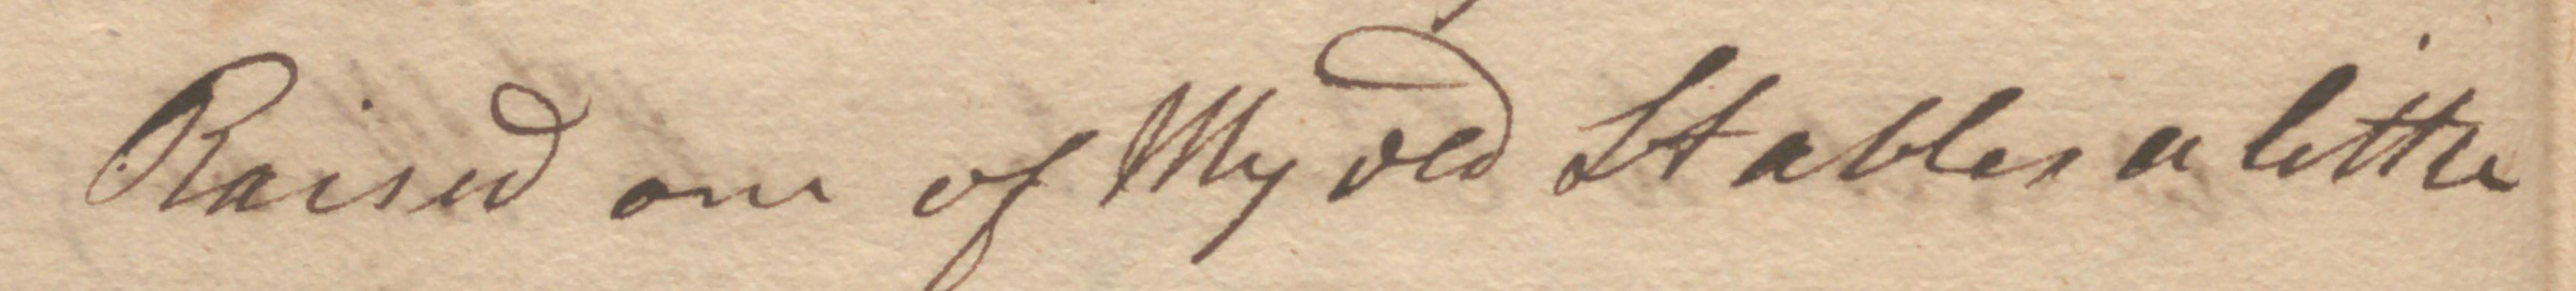Raised one of My old Stables a little
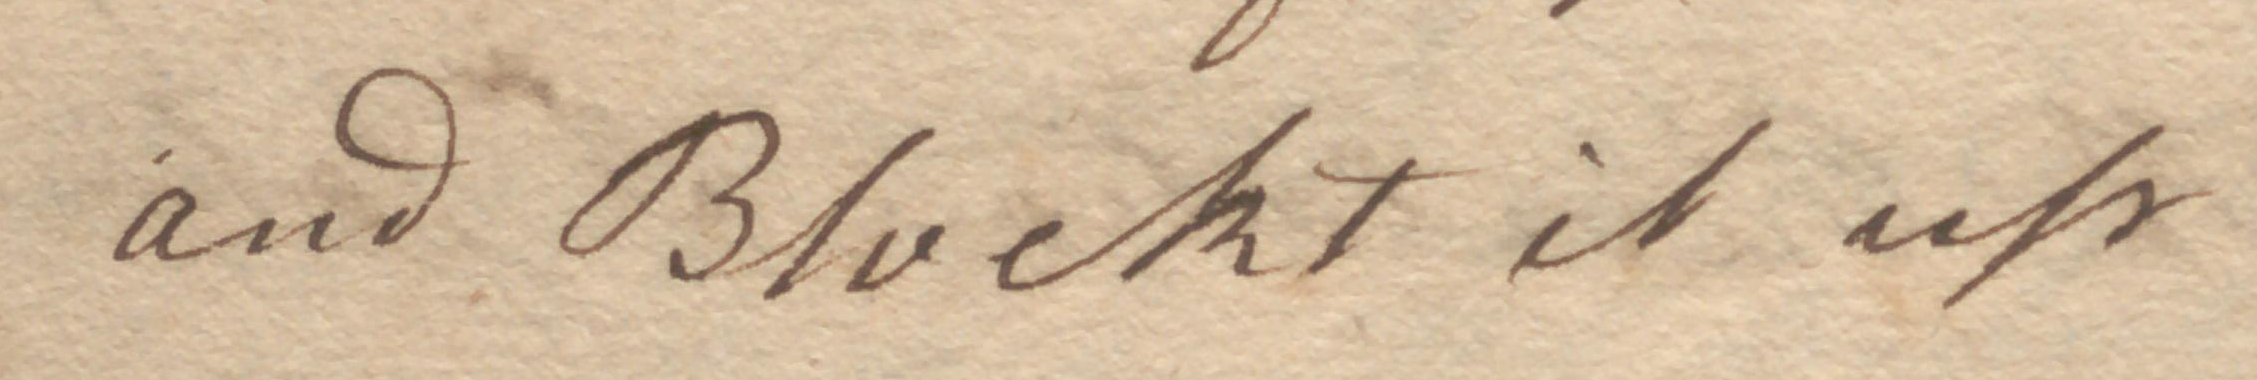and Blockt it up
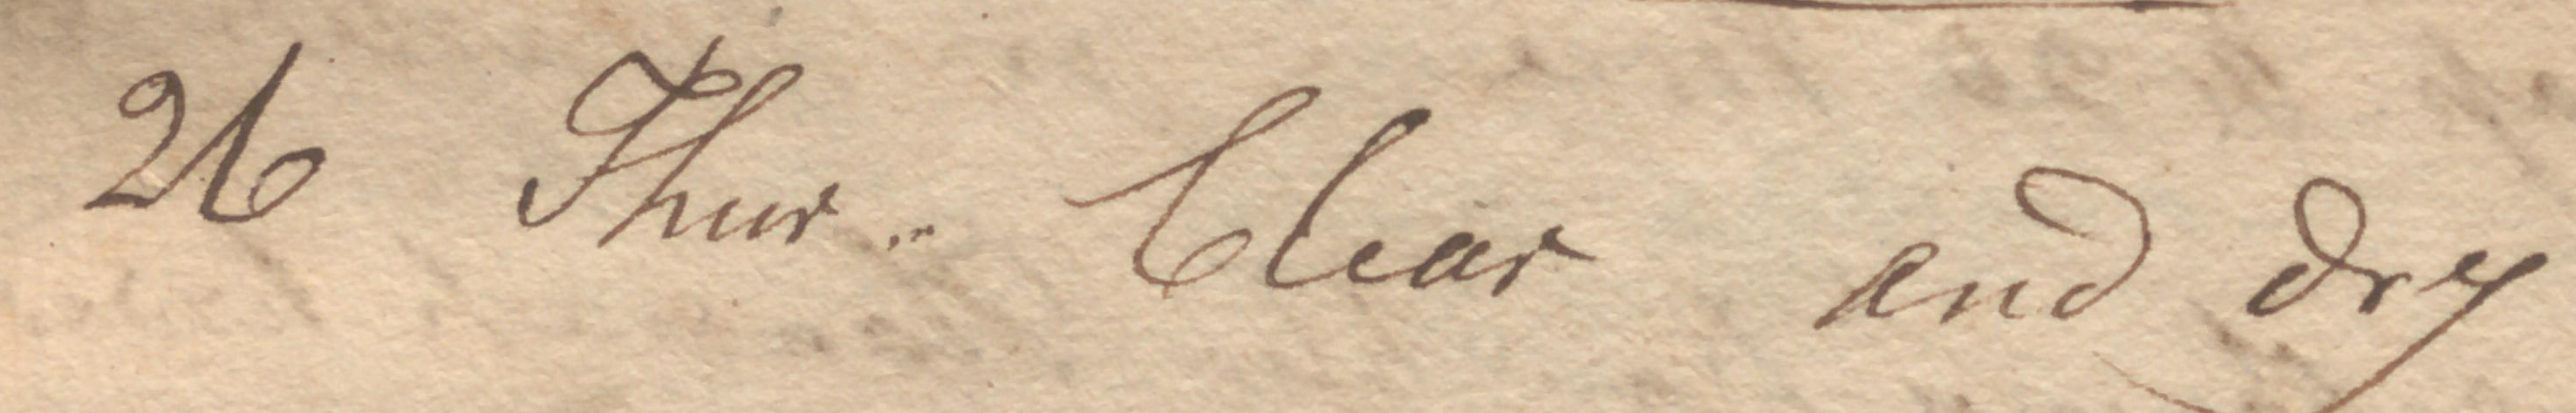26 Thur. Clear and dry
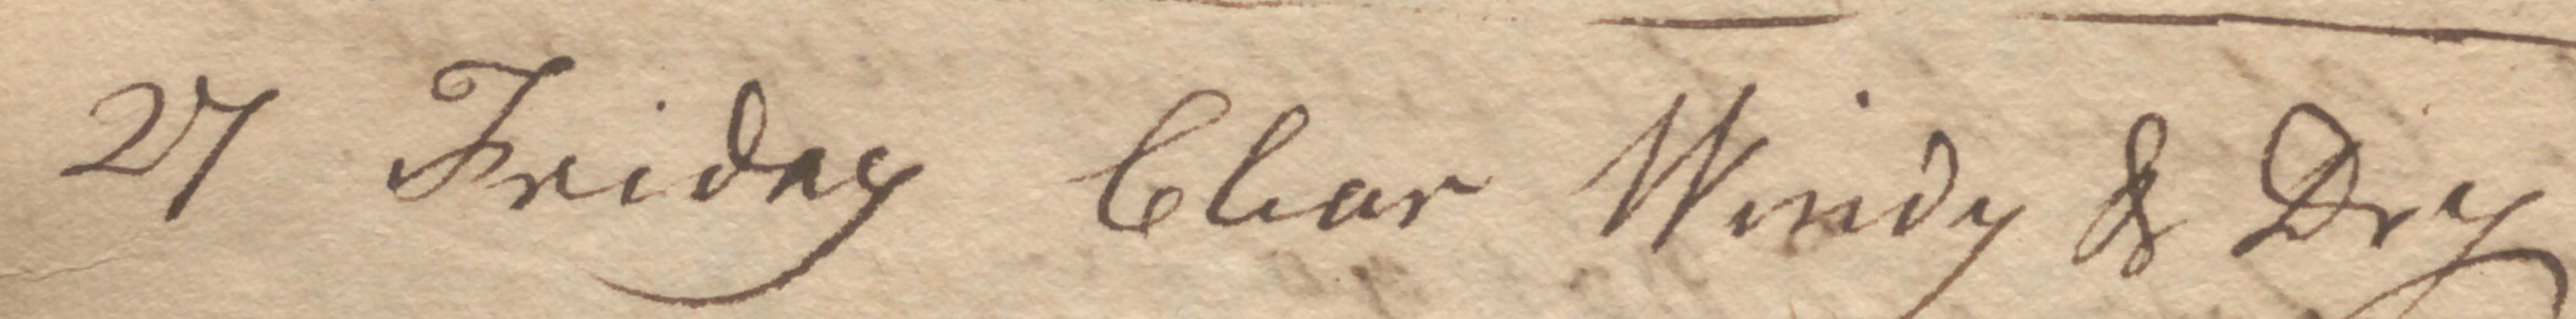27 Friday Clear Windy & Dry
